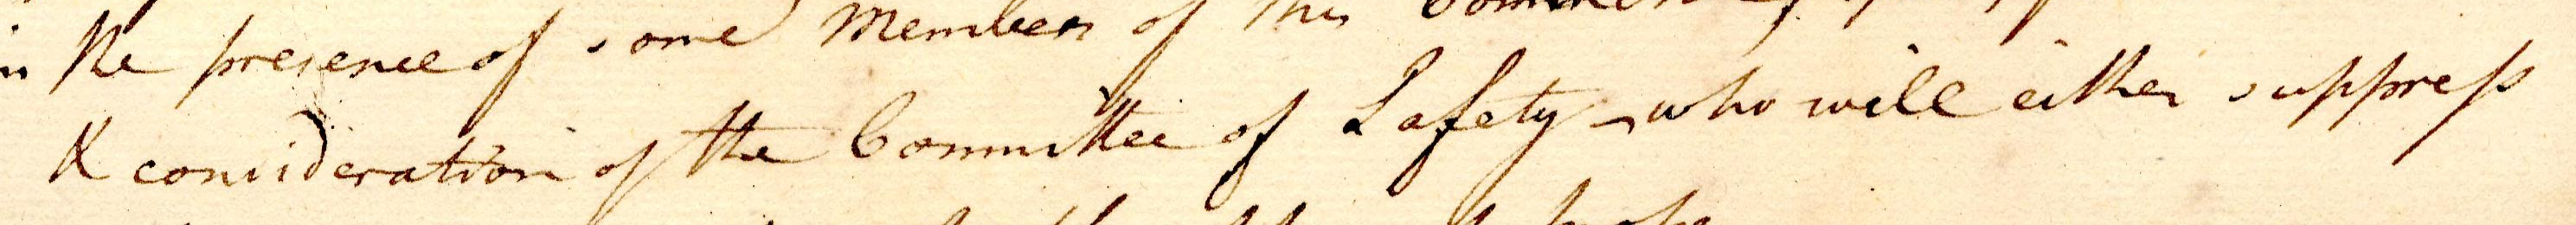& consideration of the Committee of Safety, who will either suppress
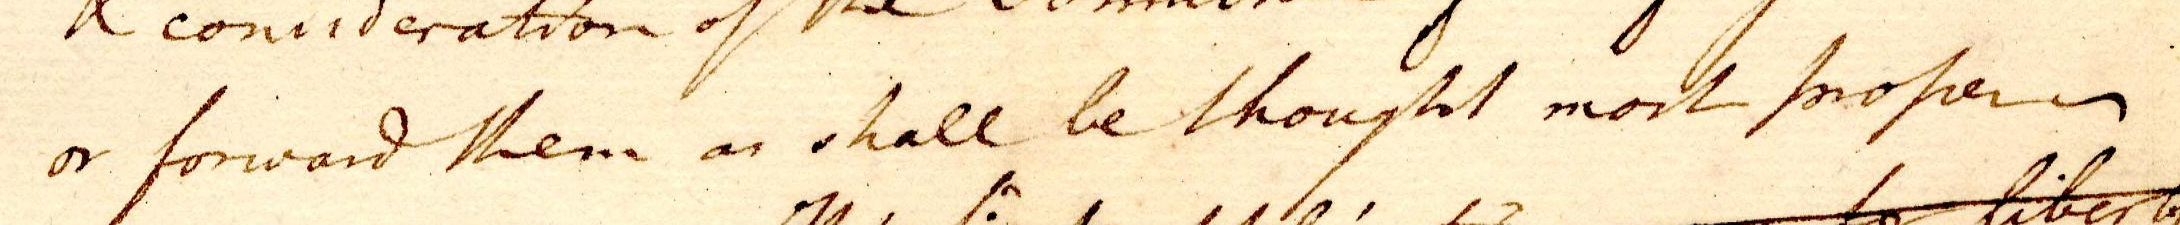or forward them as shall be thought most proper.
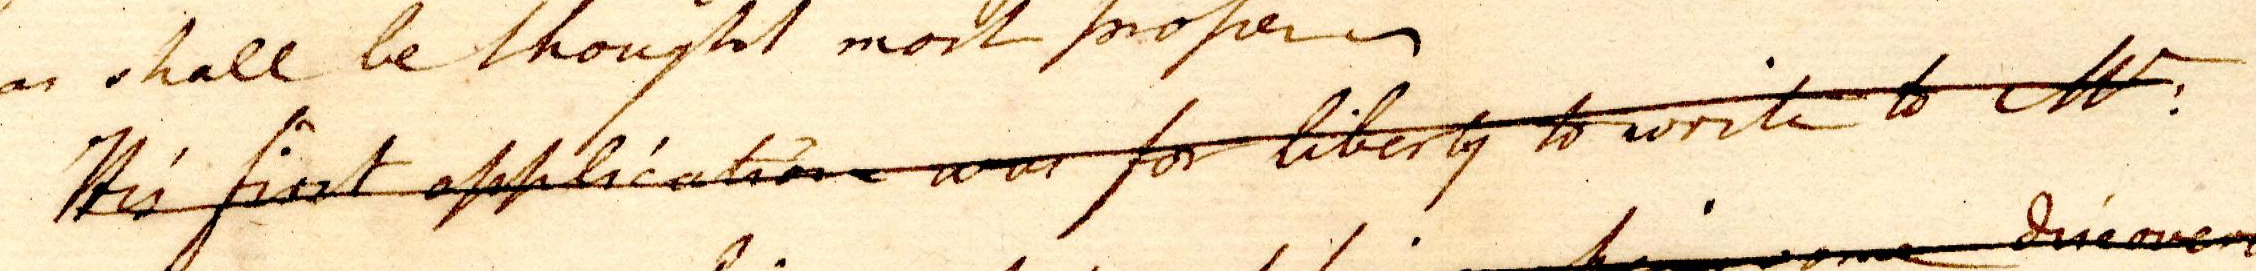[This first application was for liberty to write to M^r:]
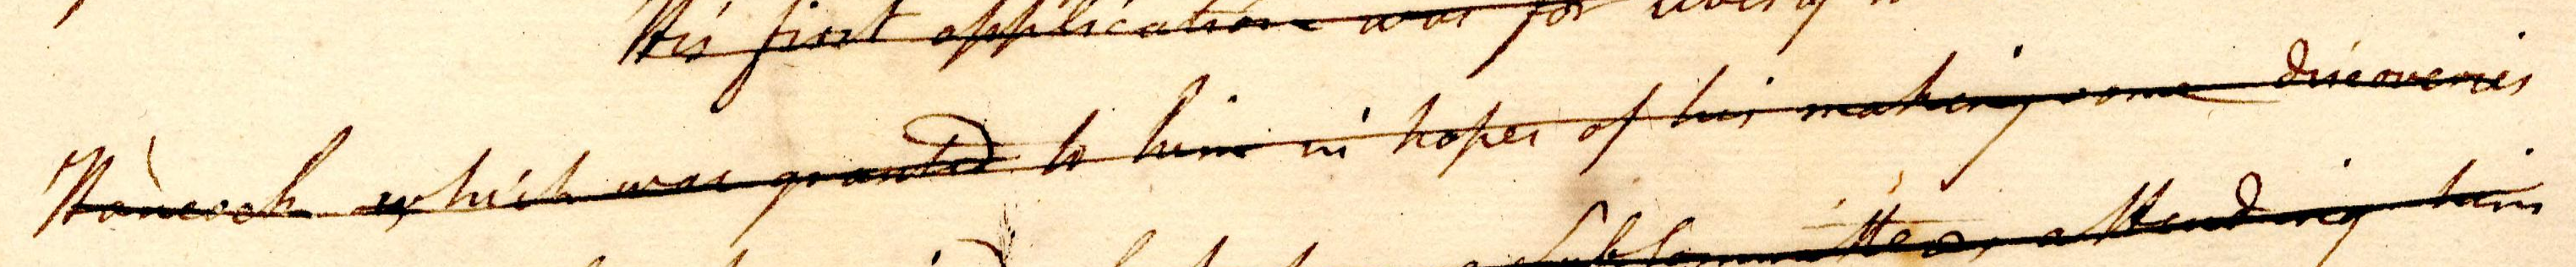[Nansch which was granted to him in hopes of his making some discoveries]
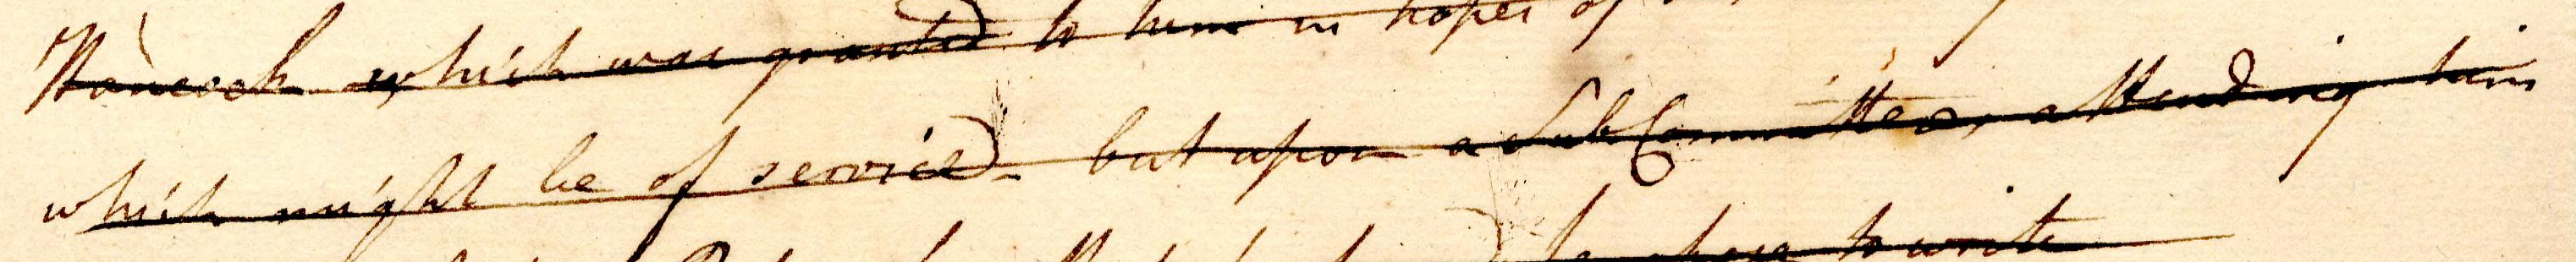[which might be of service, but upon a Sub-Committee attending him]
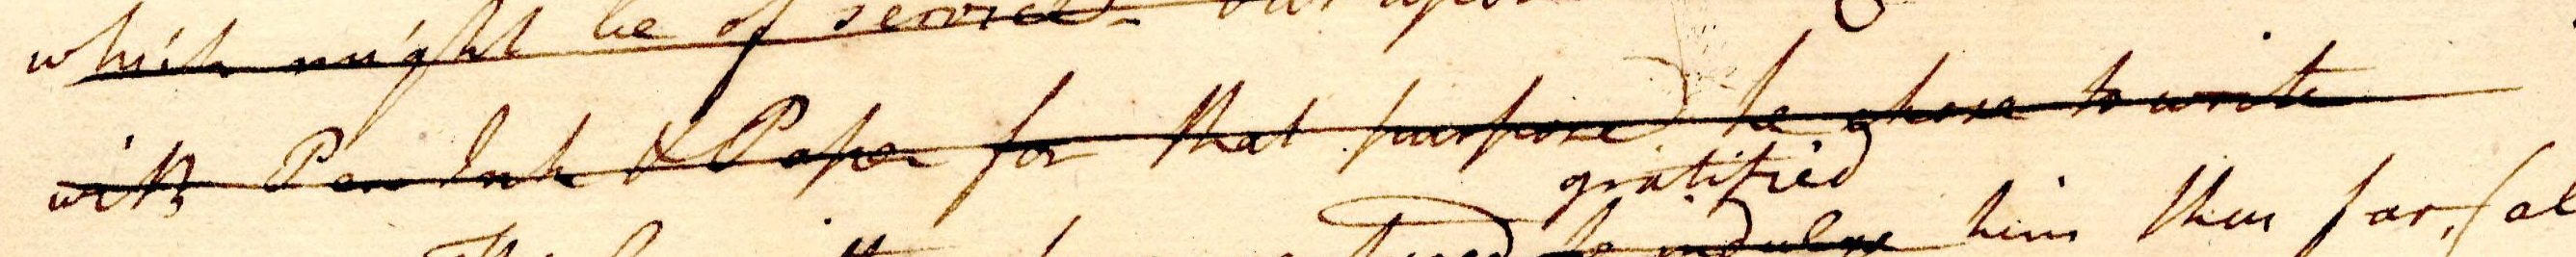[with Pen Ink & Paper for that purpose, he chose to write]
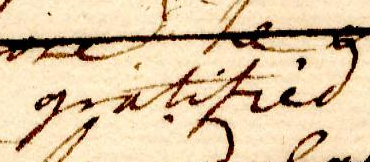gratified
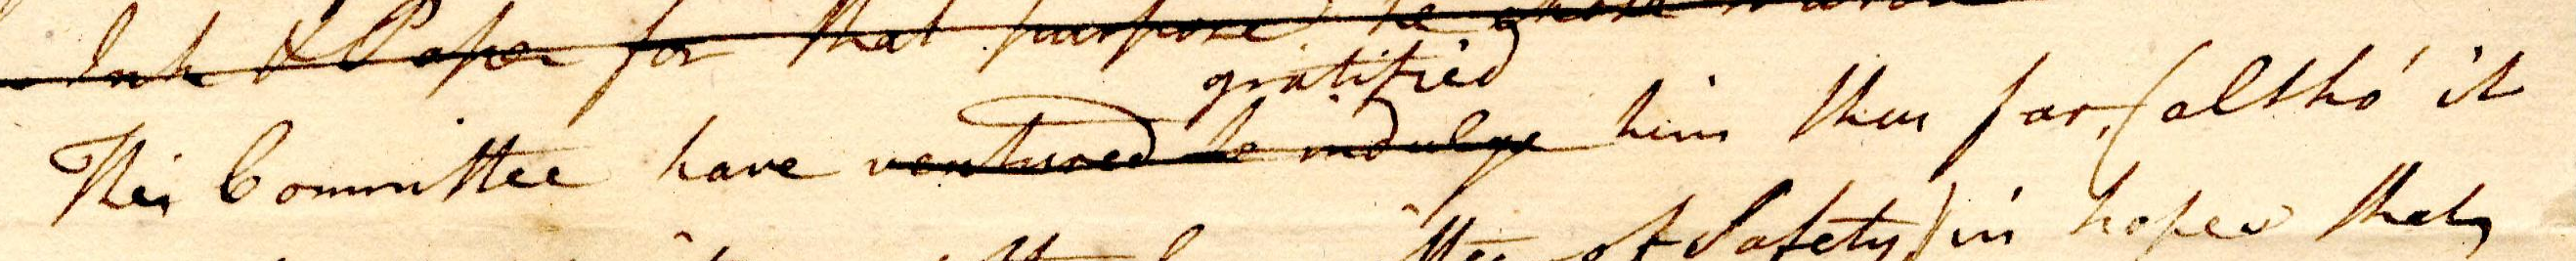This Committee have [ventured to indulge] him thus far (altho' it
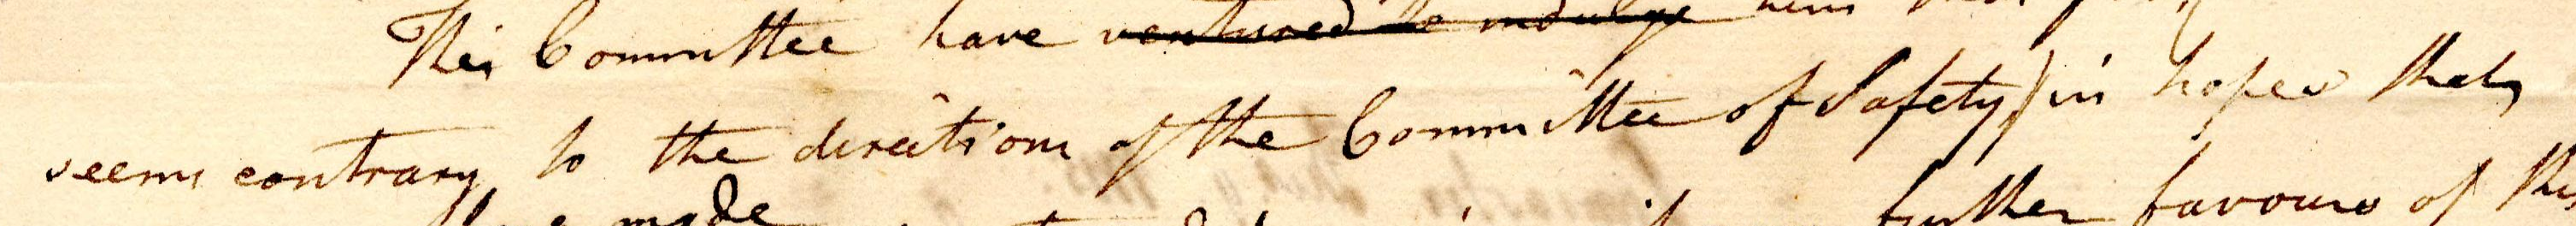seems contrary to the direction of the Committee of Safety) in hopes that
